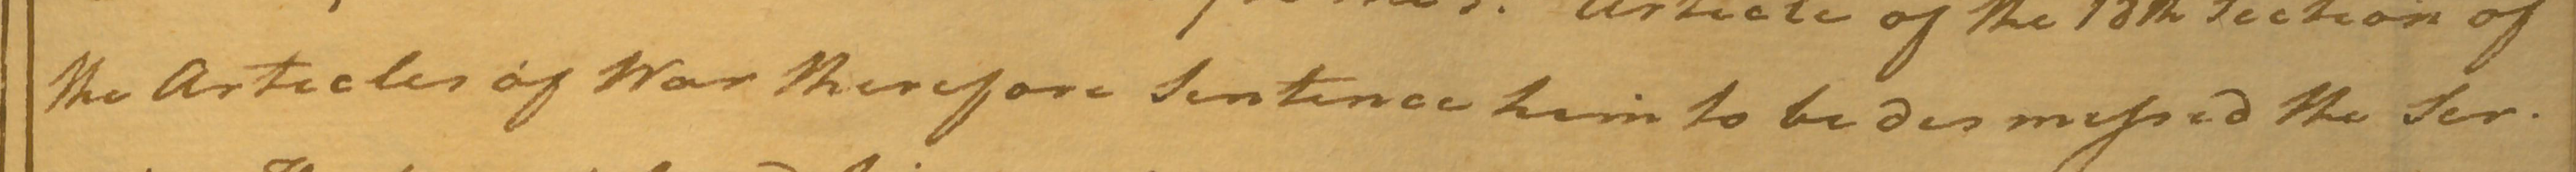the Articles of War therefore Sentence him to be dismissed the Ser
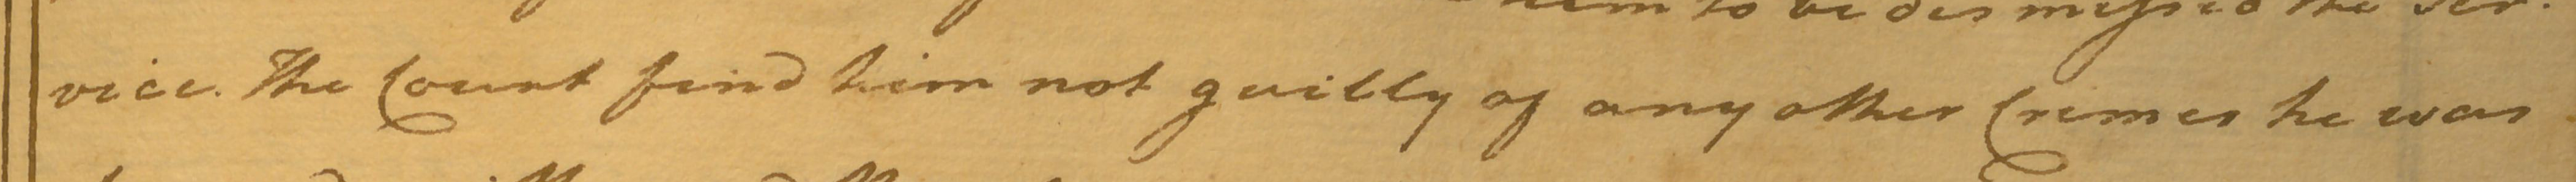vice. The Court find him not guilty of any other Crimes he was
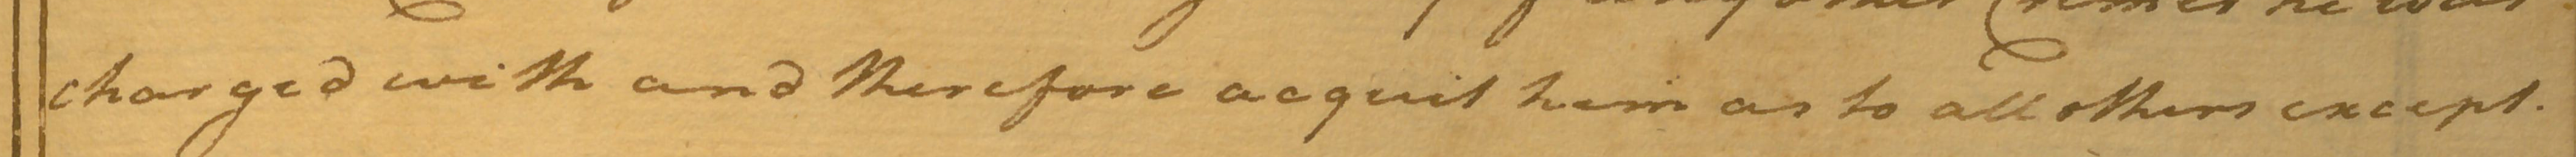charged with and therefore acquit him as to all others except
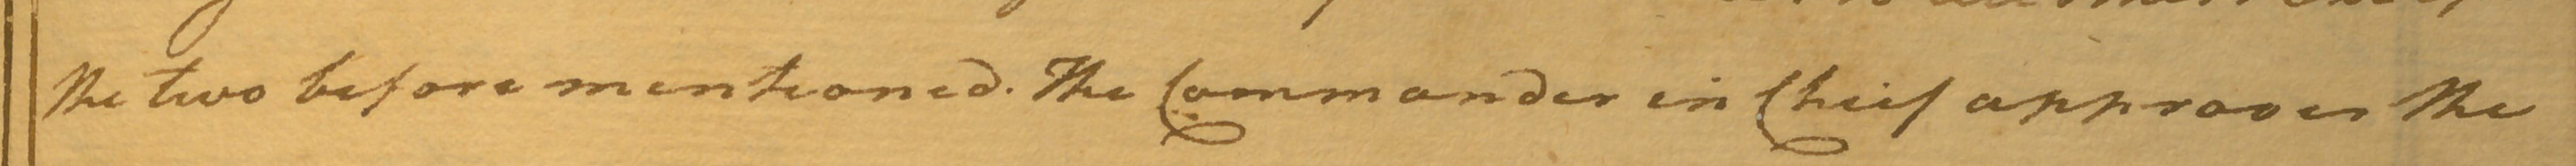the two before mentioned. The Commander in Chief approves the
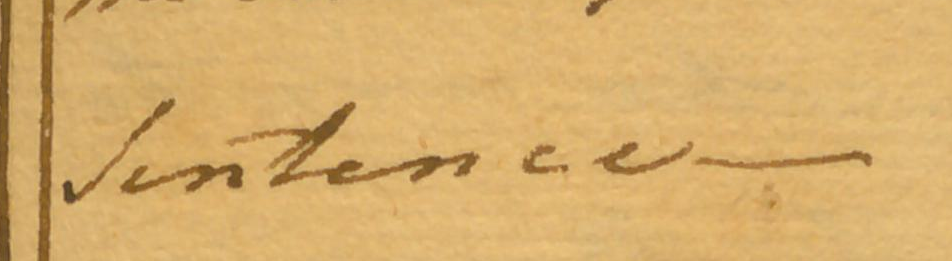Sentence-
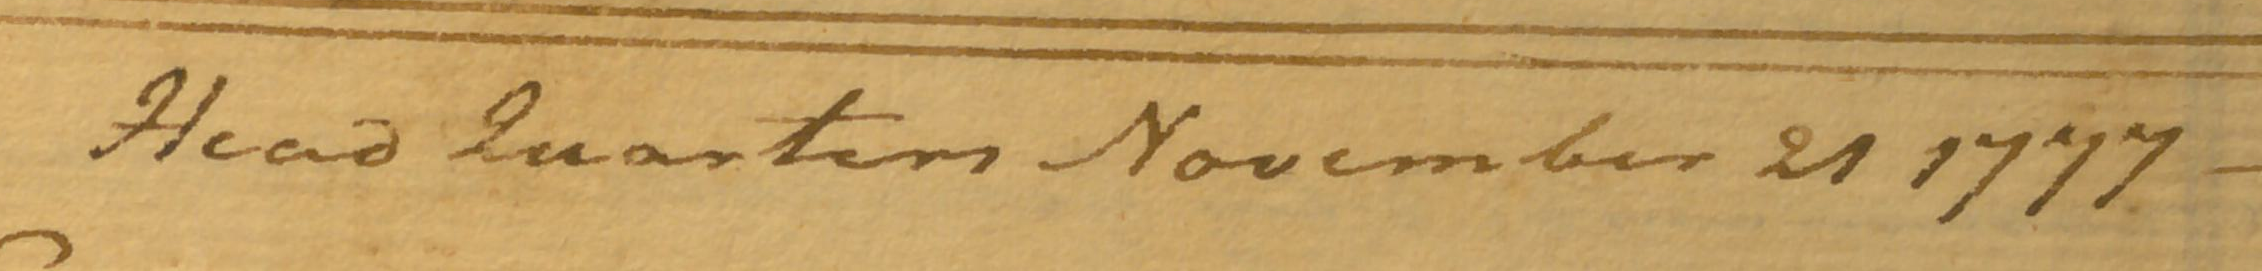Head Quarters November 21 1777
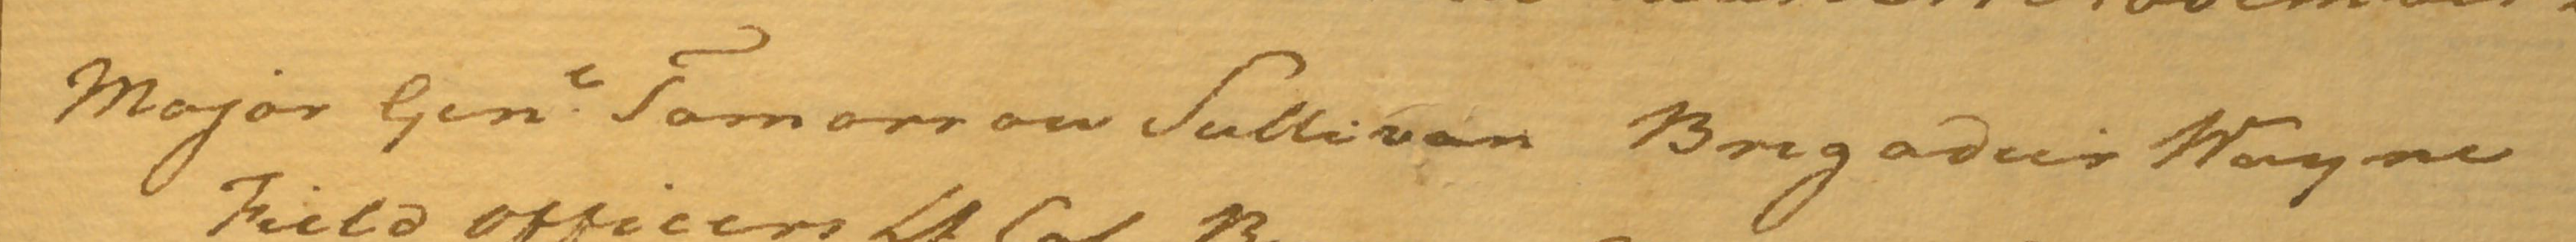Major Gen^l. Tomorrow Sullivan Brigadier Wayne
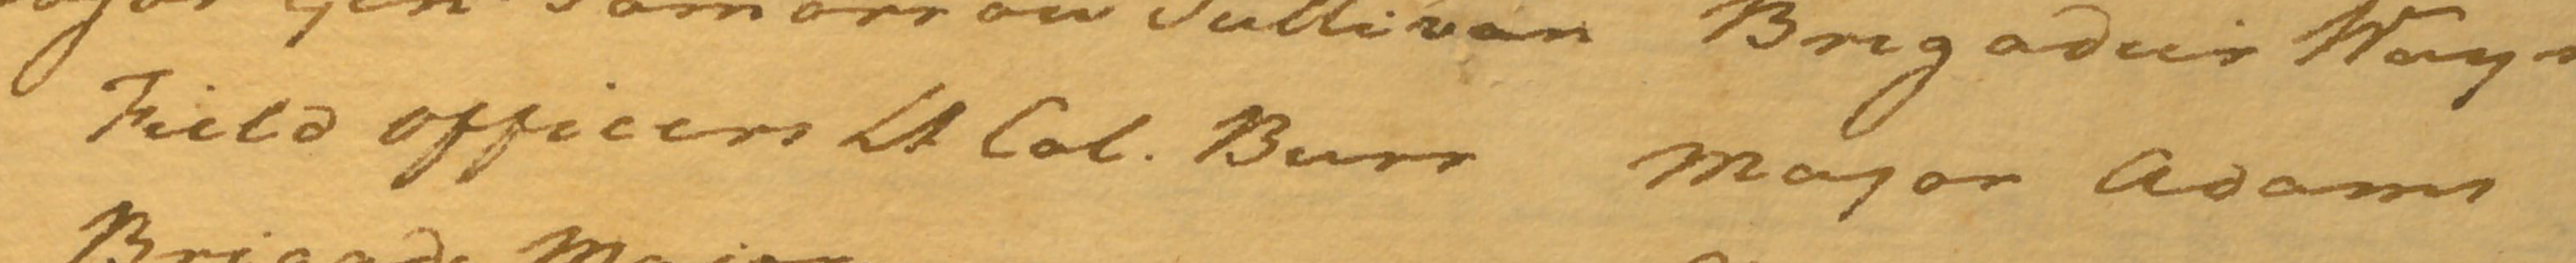Field officers Lt Col. Burr Major Adams
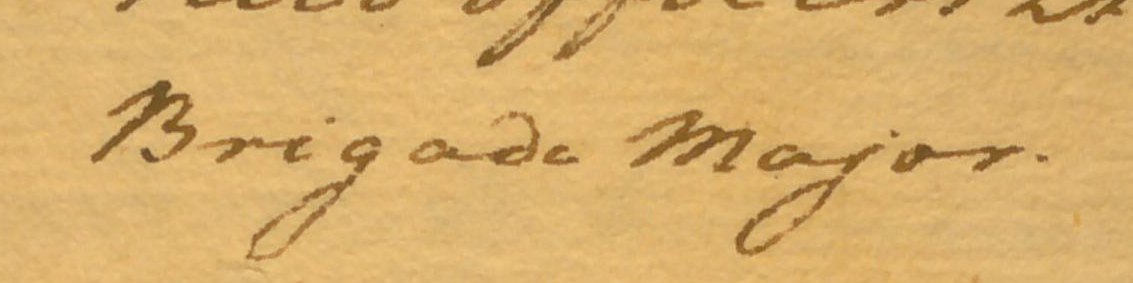Brigade Major.
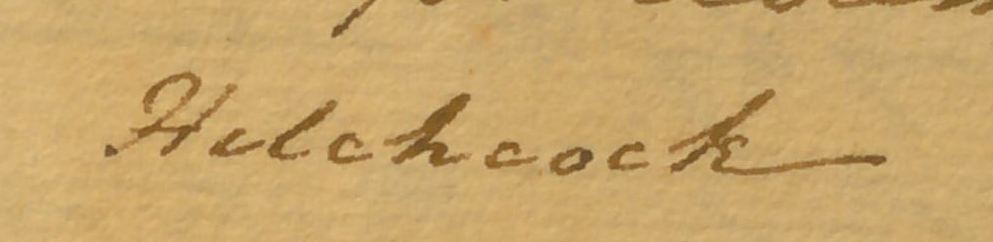Hitchcock
